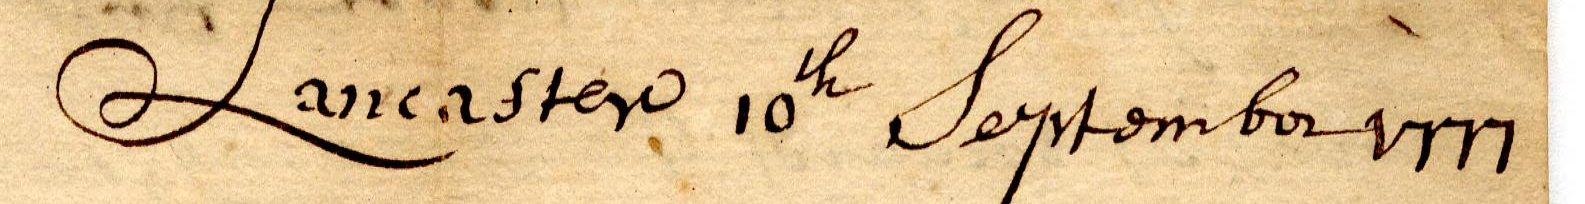Lancaster 10^th September 1777
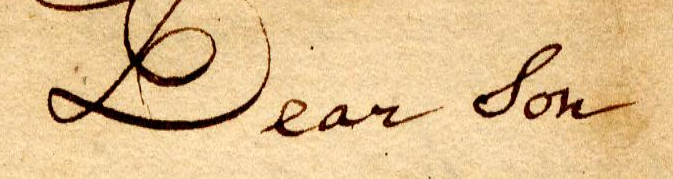Dear Son
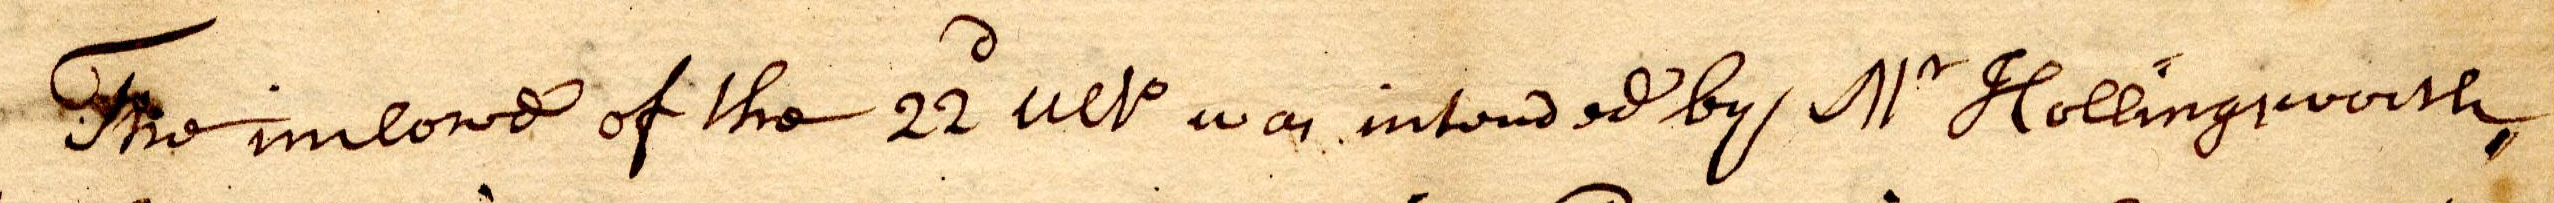The inclosed of the 22^d Ult^o was intended by M^r Hollingsworth,
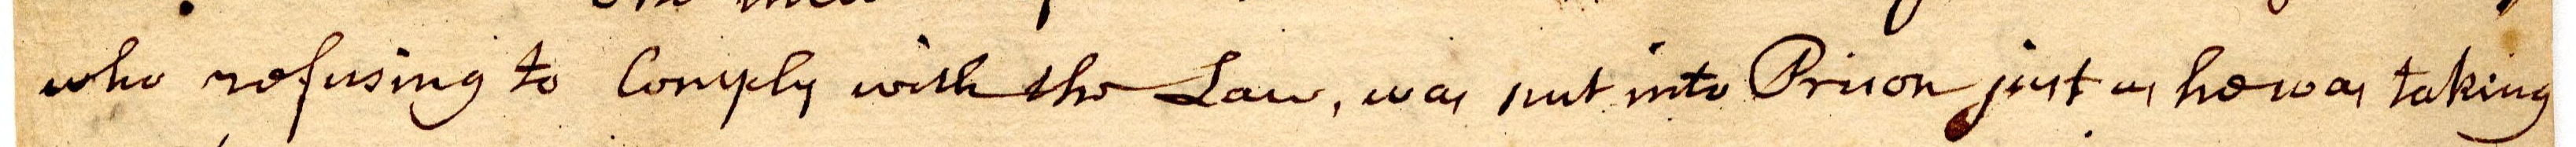who refusing to comply with the Law, was sent into Prison just as he was taking
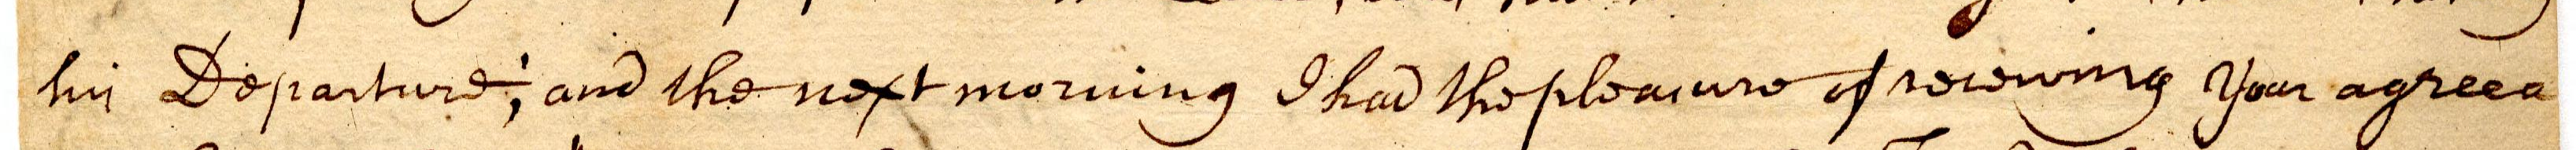his Departure; and the next morning I had the pleasure of receiving Your agreea
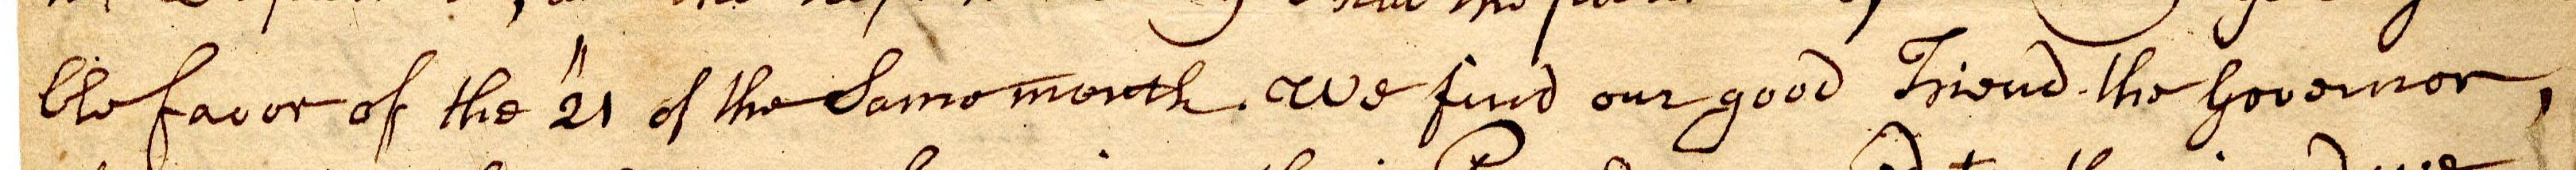ble favor of the 21 of the same month. We find our good Friend the Governor,
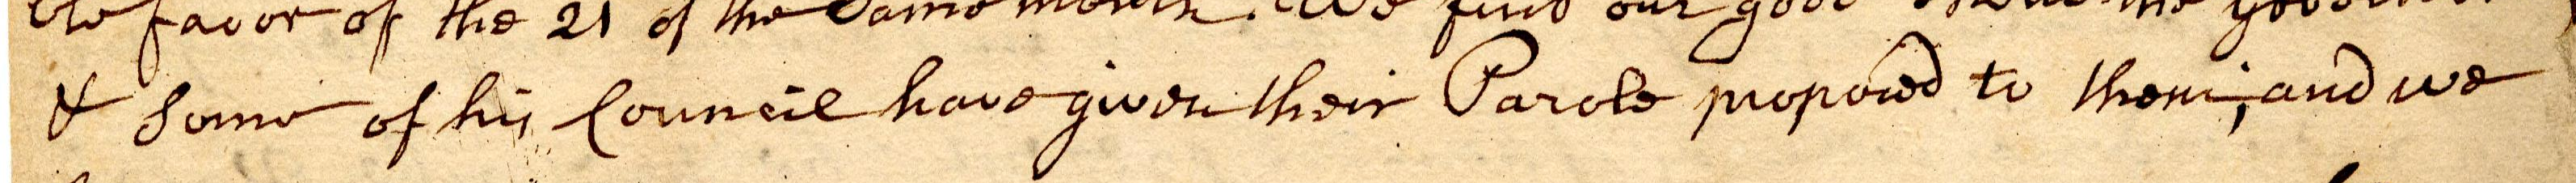& some of his Council have given their Parels proposed to them; and we
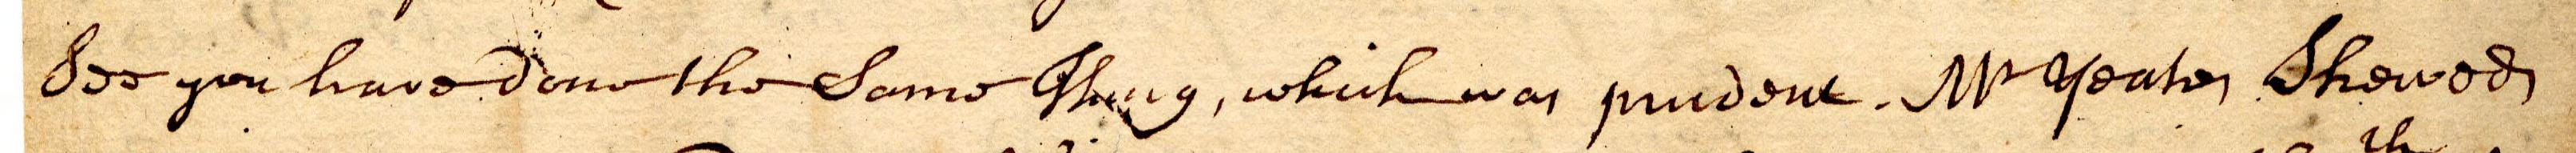see you have done the same Thing, which was prudent. M^r Yeates showed
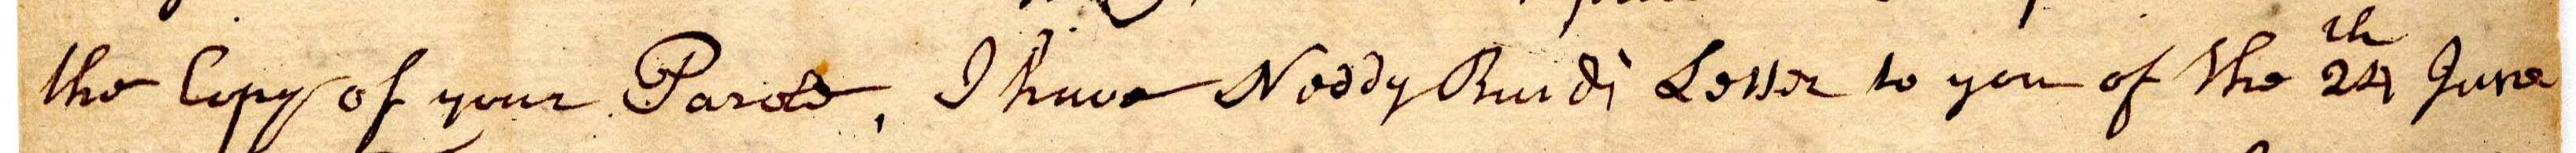the Copy of your Parels, I have Neddy Burd's Letter to you of the 24^th June
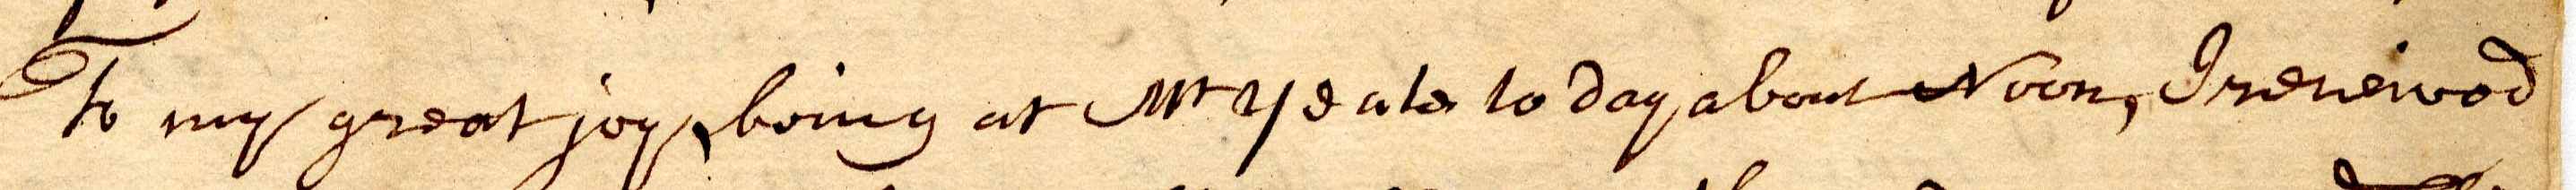To my great joy, being at M^r Yeates to day about Noon, I received
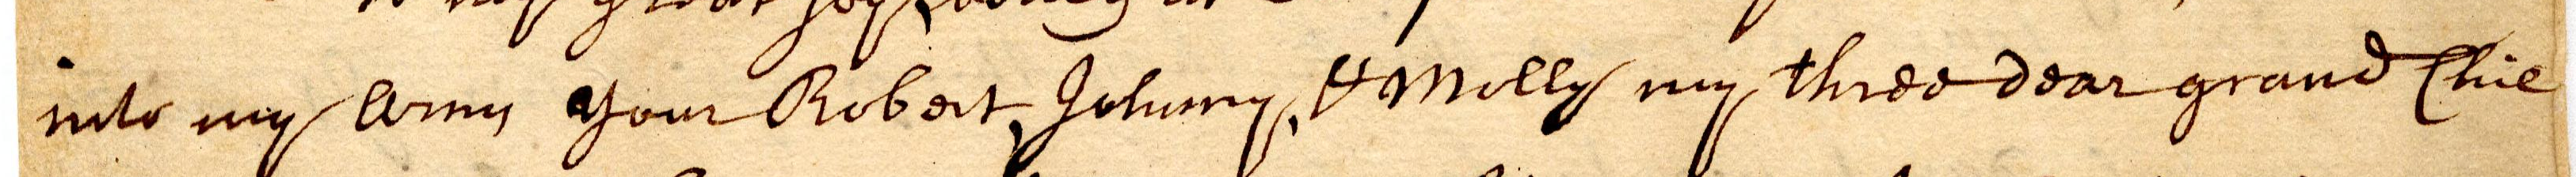into my Arms your Robert, Johnny, & Molly my three dear grand Chil
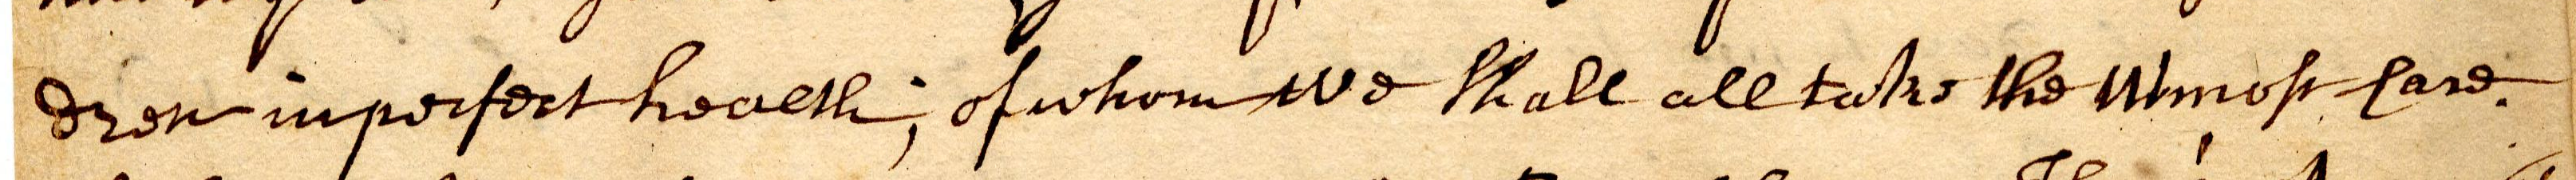dren in perfect health; of whom we shall all take the Utmost Care.
